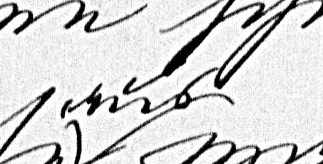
aus
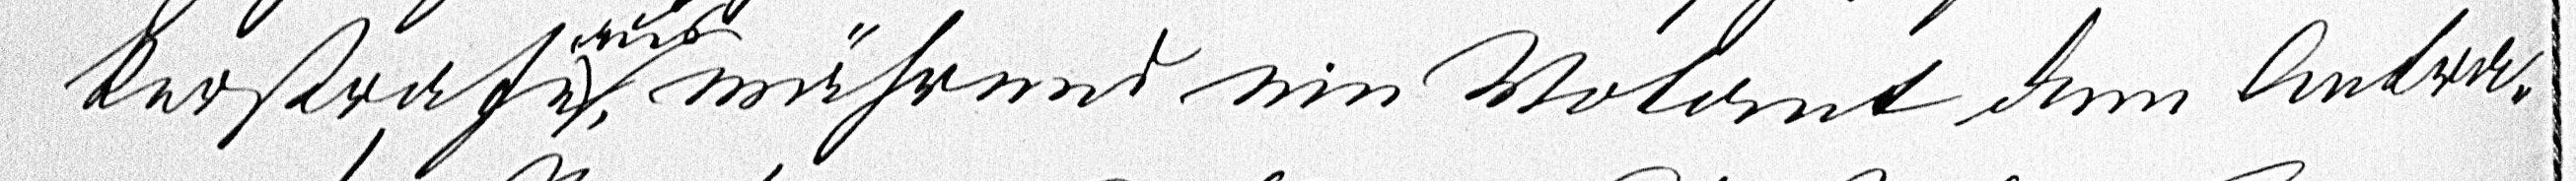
kerstrafe während ein Volant dem Antra¬
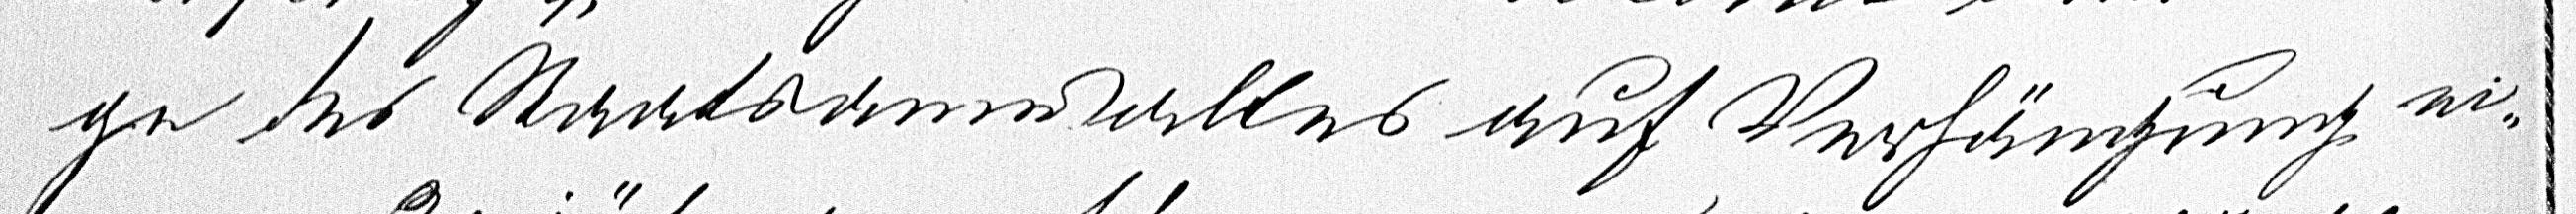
ge des Staatsanwaltes auf Verhängung ei¬
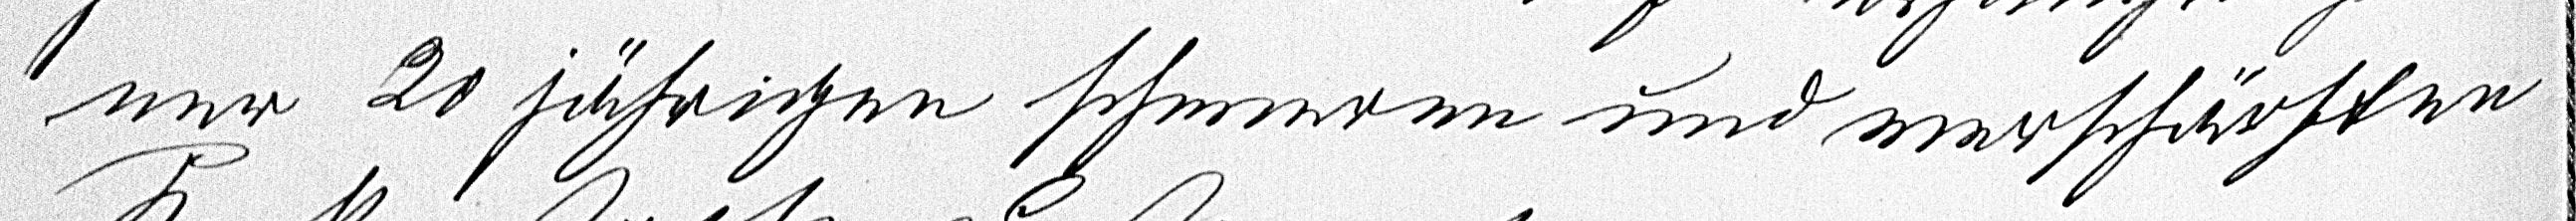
ner 20 jährigen schweren und verschärften
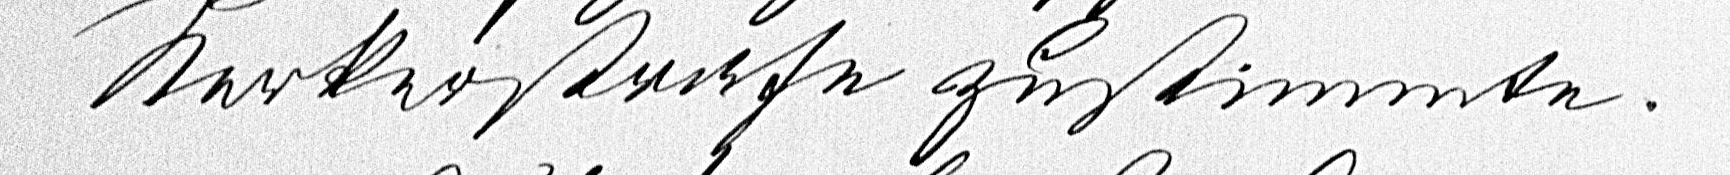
Kerkerstrafe zustimmte.
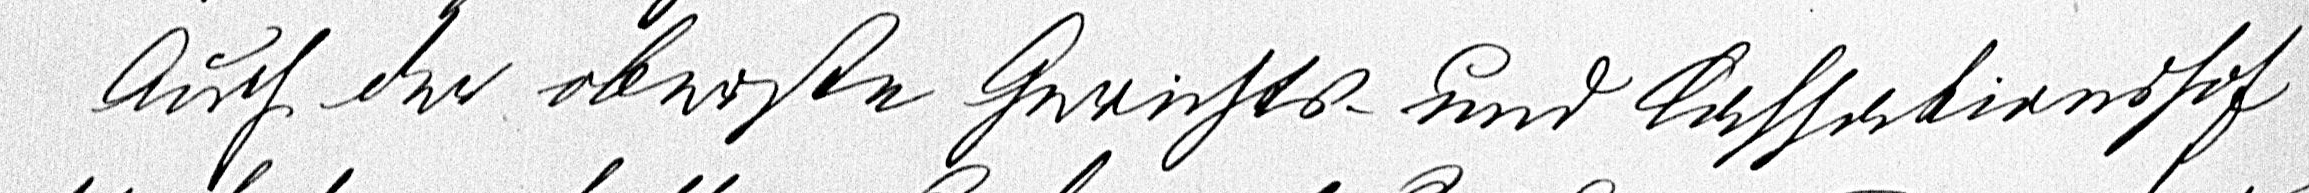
Auch der oberste Gerichts- und Cassatienshof
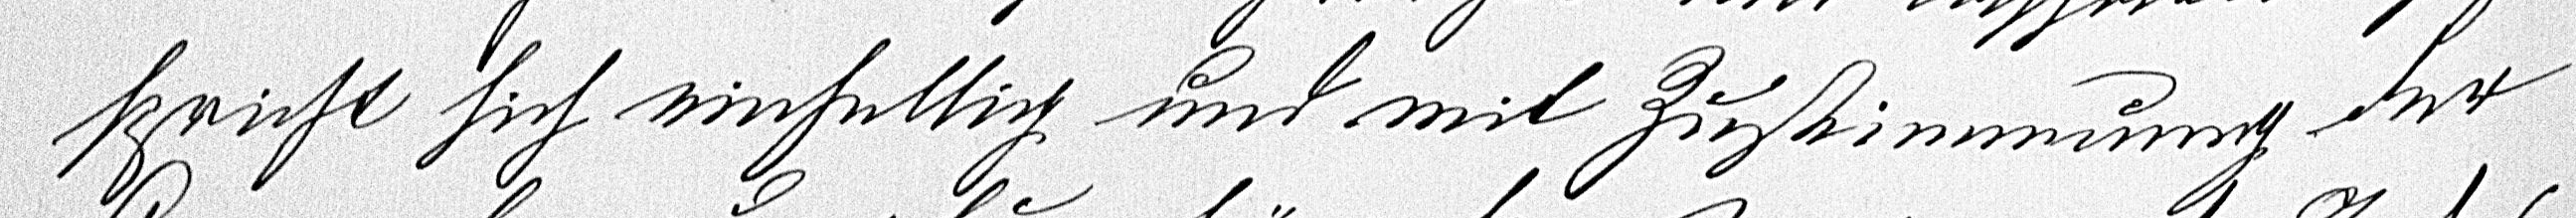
spricht sich einhellig und mit Zustimmung der
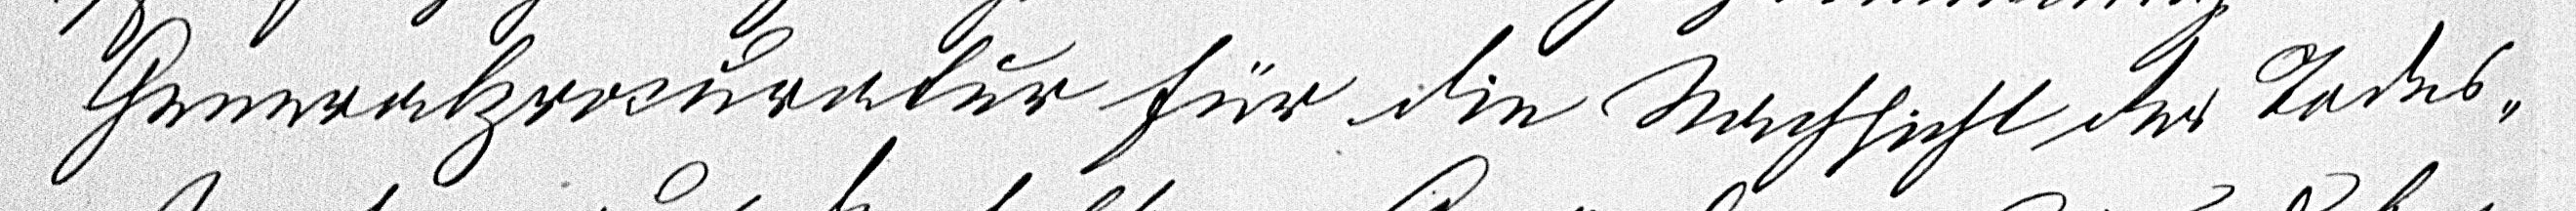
Generalprocuratur für die Nachsicht der Todes¬
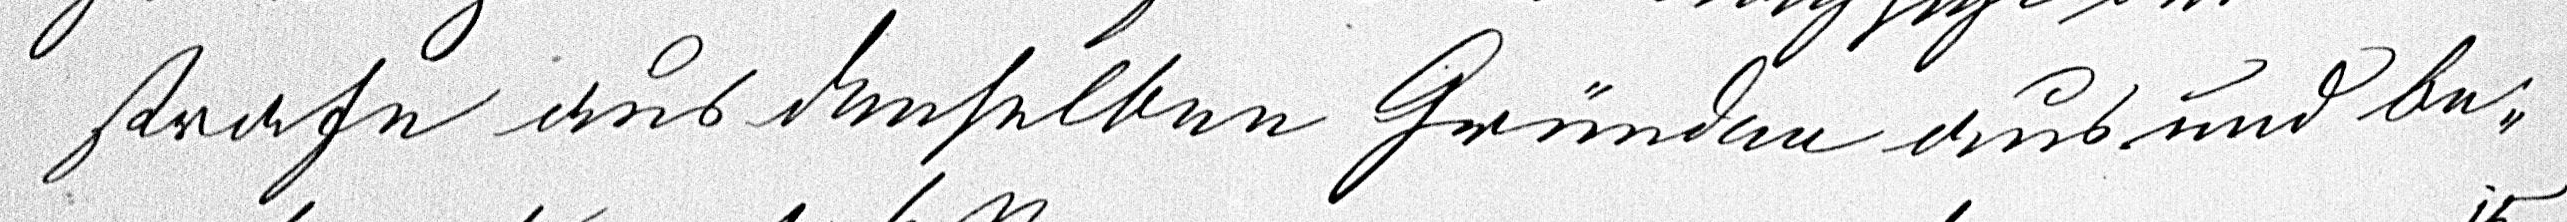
strafe aus denselben Gründen aus und be¬
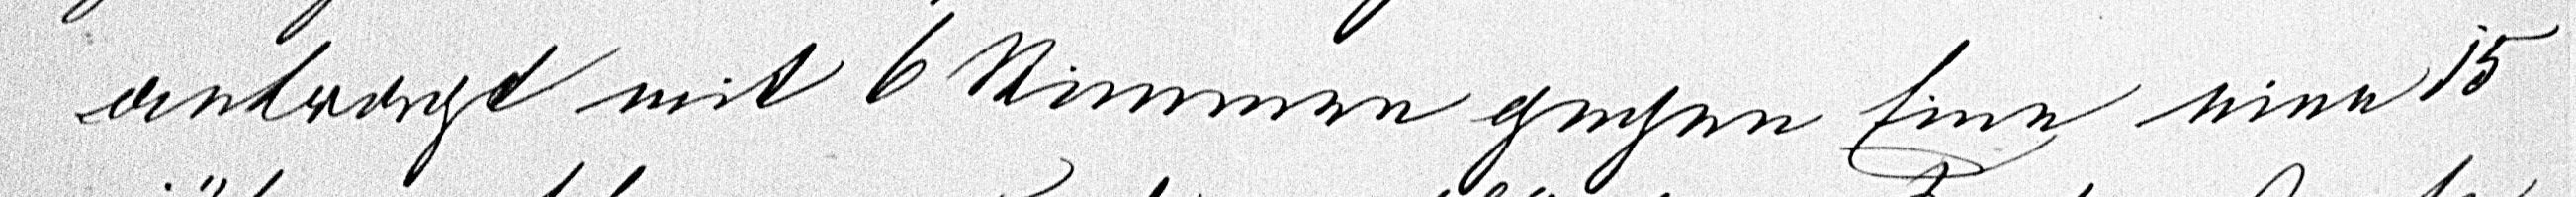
antragt mit 6 Stimmen gegen Eine eine 15
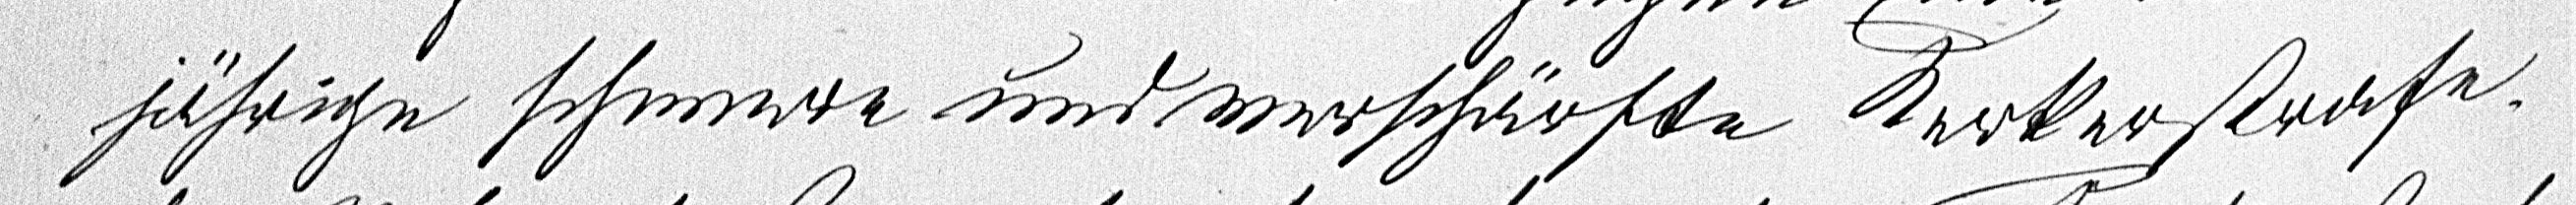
jährige schwere und verschärfte Kerkerstrafe.
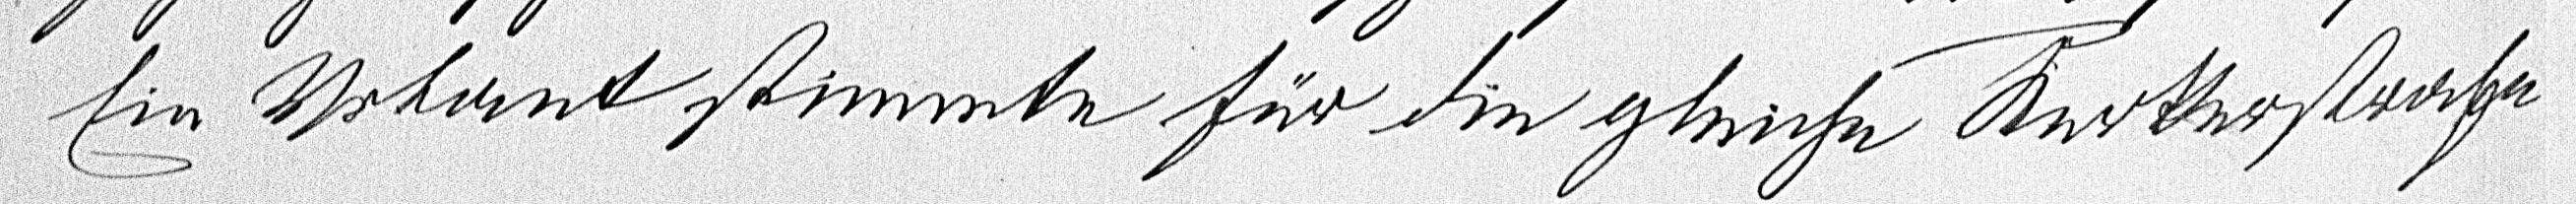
Ein Volant stimmte für die gleiche Kerkerstrafe
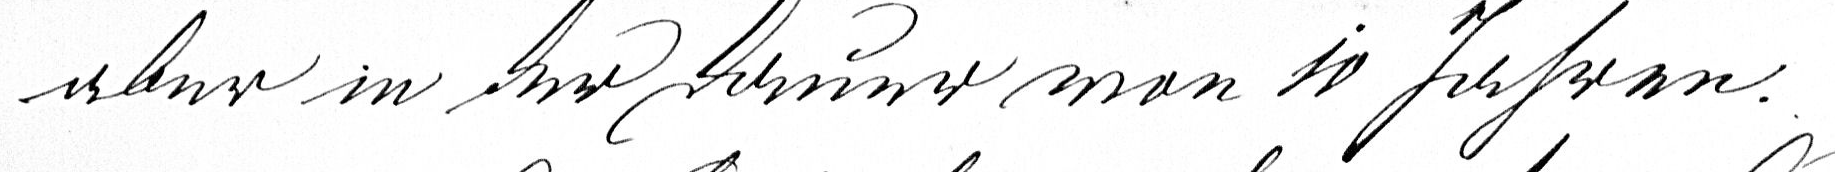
aber in der Dauer von 10 Jahren.
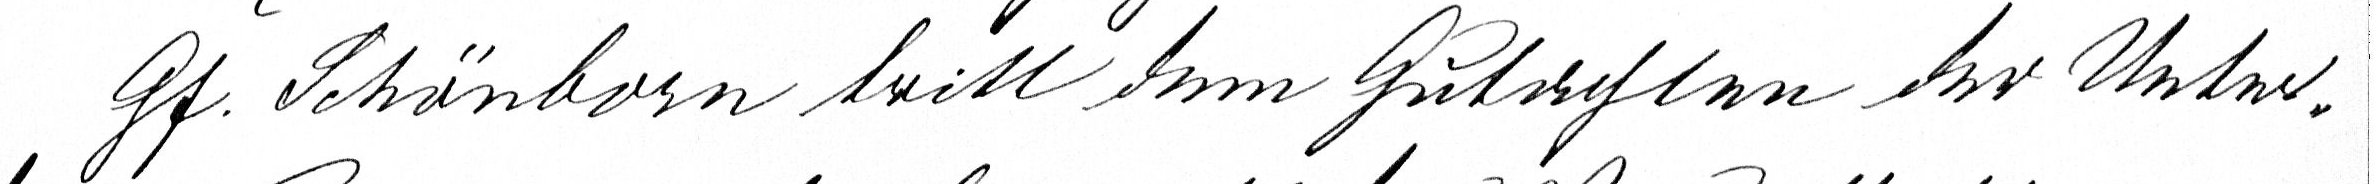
Gf. Schönborn tritt dem Gutachten der Unter¬
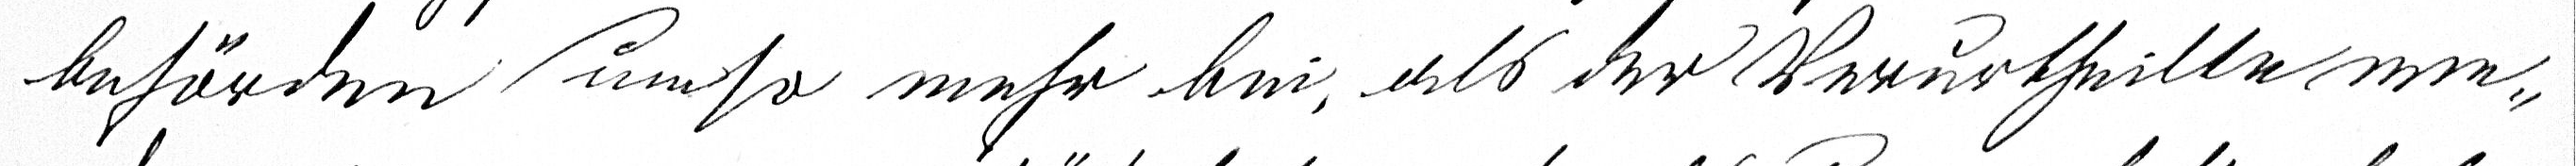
behörden umso mehr bei, als der Verurtheilte we¬
